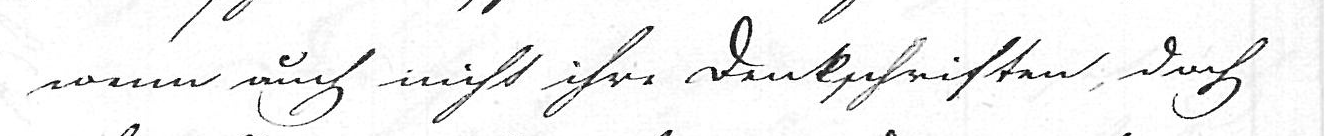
wenn auch nicht ihre Denkschriften, doch
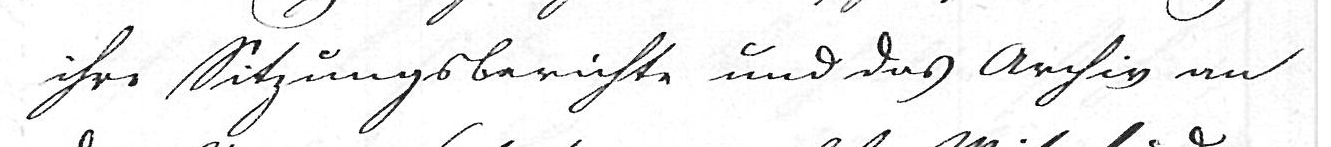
ihre Sitzungsberichte und das Archiv an
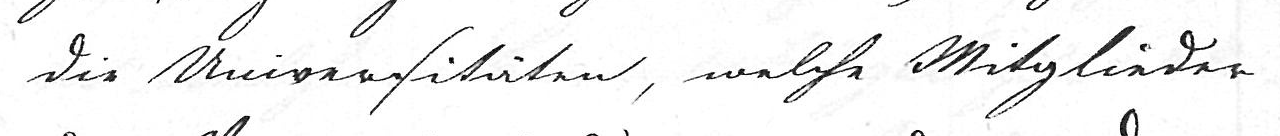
die Universitäten, welche Mitglieder
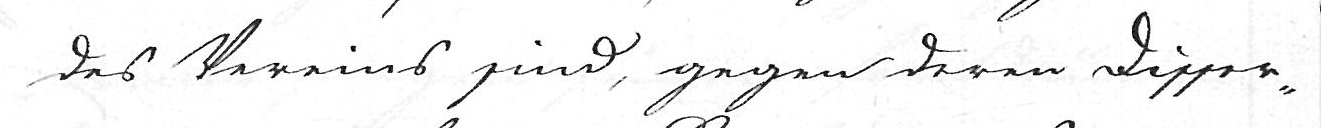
des Vereins sind, gegen deren Disser-
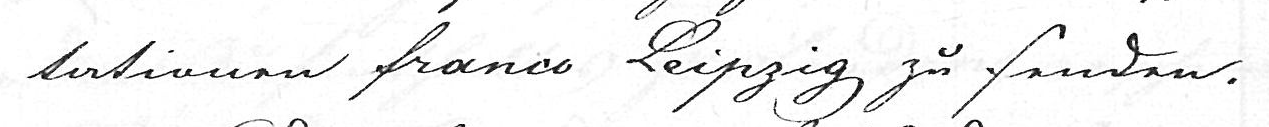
tationen franco Leipzig zu senden.
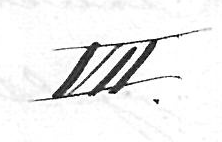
VII.
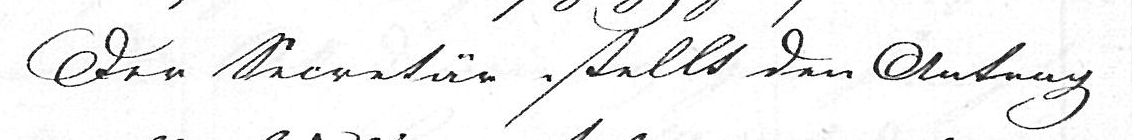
Der Secretär stellt den Antrag
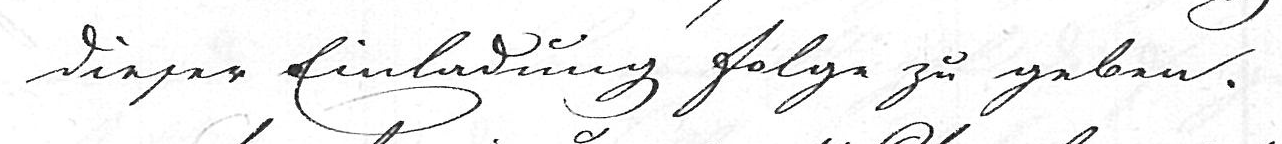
dieser Einladung Folge zu geben.
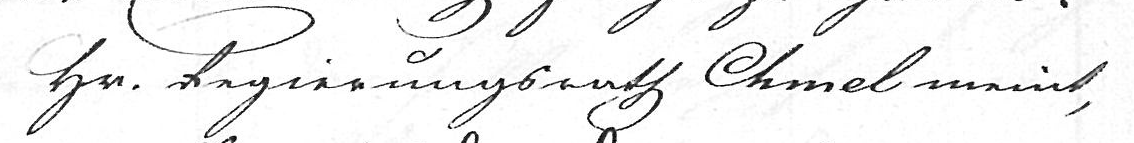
Hr. Regierungsrath Chmel meint,
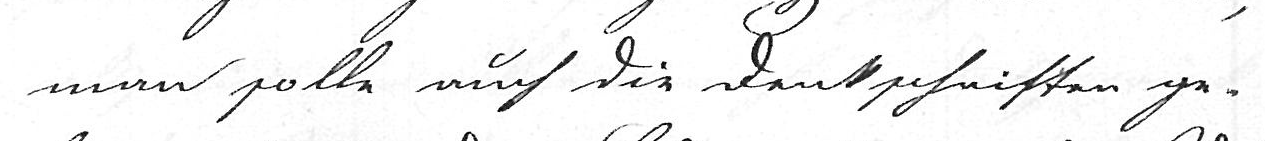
man solle auch die Denkschriften ge-
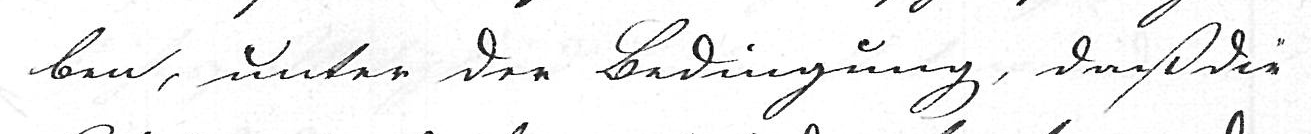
ben, unter der Bedingung, daß die
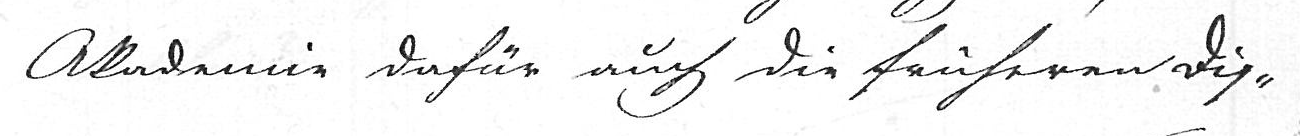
Akademie dafür auch die früheren Dis-
